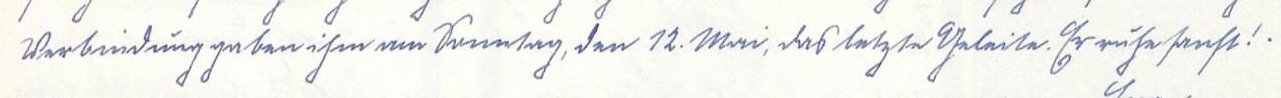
Verbindung gaben ihm am Sonntag, den 12. Mai, das letzte Geleite. Er ruhe sanft!-
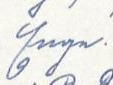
Enge.
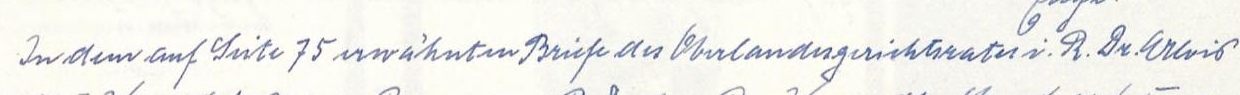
In dem auf Seite 75 erwähnten Briefe des Oberlandesgerichtrates i. R. Dr. Alois
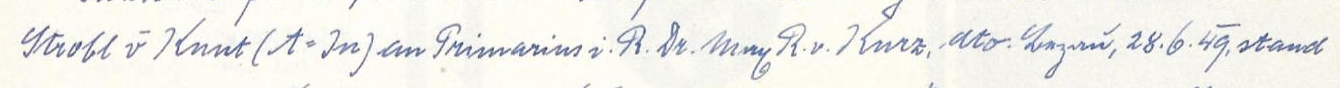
Strobl v/o Knut (A- In) an Primarius i. R. Dr. Max R. v. Kurz, dto. Bezau, 28.6. 49 stand
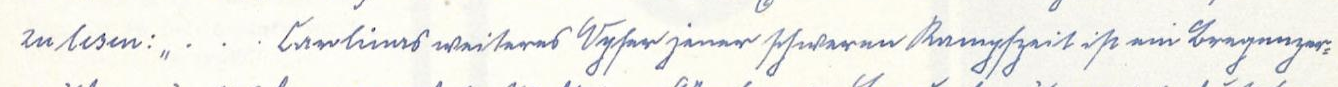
zu lesen: "Carolinas weiteres Opfer jener schweren Kampfzeit ist ein Bregenzer-
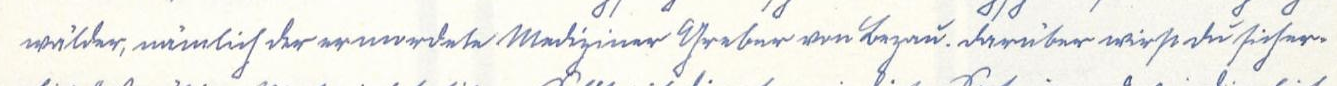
wälder, nämlich der ermordete Mediziner Greber von Bezau. Darüber wirst du sicher-
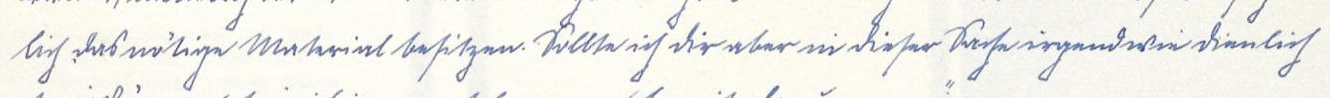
lich das nötige Material besitzen. Sollte ich dir aber in dieser Sache irgendwie dienlich
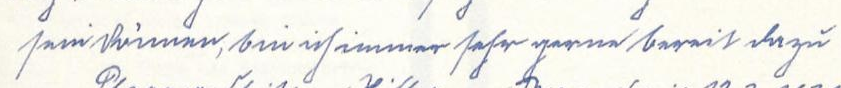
sein können, bin ich immer sehr gerne bereit dazu..."
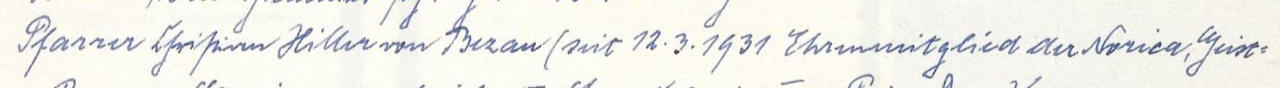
Pfarrer Christian Hiller von Bezau (seit 12.3. 1931 Ehrenmitglied der Norica, Geist-
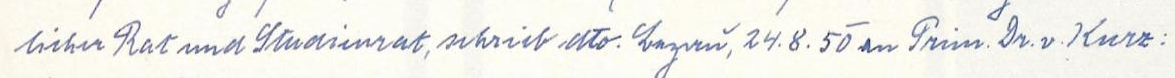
licher Rat und Studienrat, schrieb dto. Bezau, 24.8. 50 an Prim. Dr. v. Kurz:
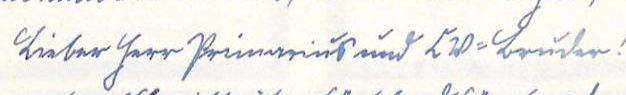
Lieber Herr Primarius und CV-Bruder!
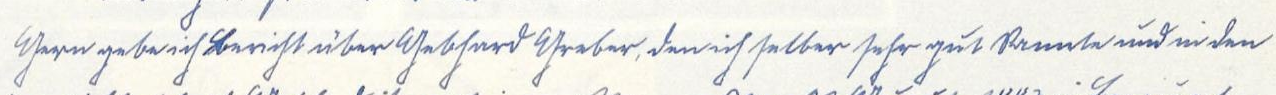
Gern gebe ich Bericht über Gebhard Greber, den ich selber sehr gut kannte und in den
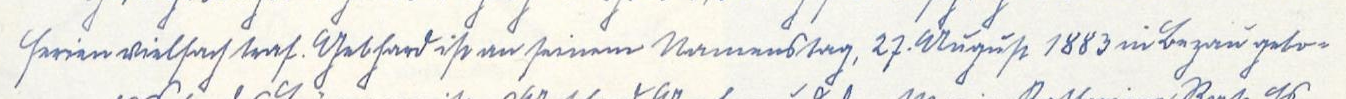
Ferien vielfach traf. Gebhard ist an seinem Namenstag, 27. August 1883 in Bezau gebo-
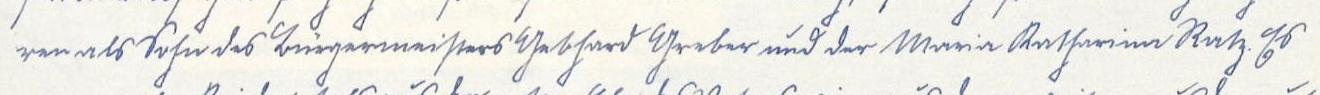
ren als Sohn des Bürgermeisters Gebhard Greber und der Maria Katharina Ratz. Es
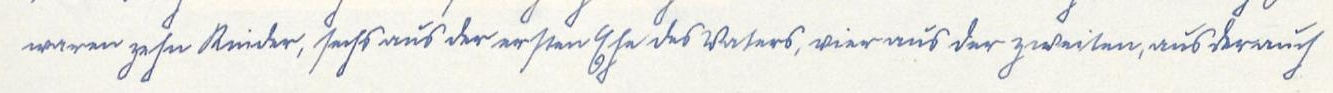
waren zehn Kinder, sechs aus der ersten Ehe des Vaters, vier aus der zweiten, aus der auch
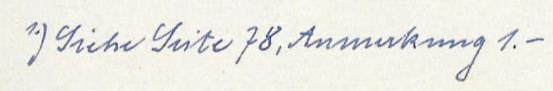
1.) Siehe Seite 78, Anmerkung 1.-
